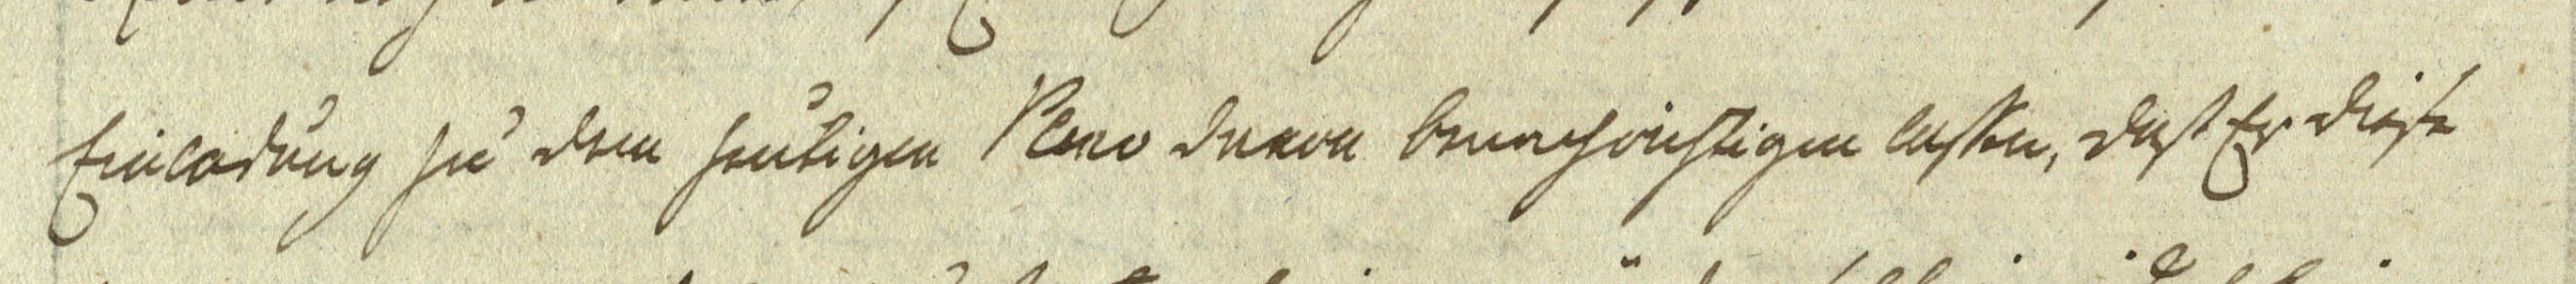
Einladung zu dem heutigen Pleno davon benachrichtigen lassen, daß Er diese
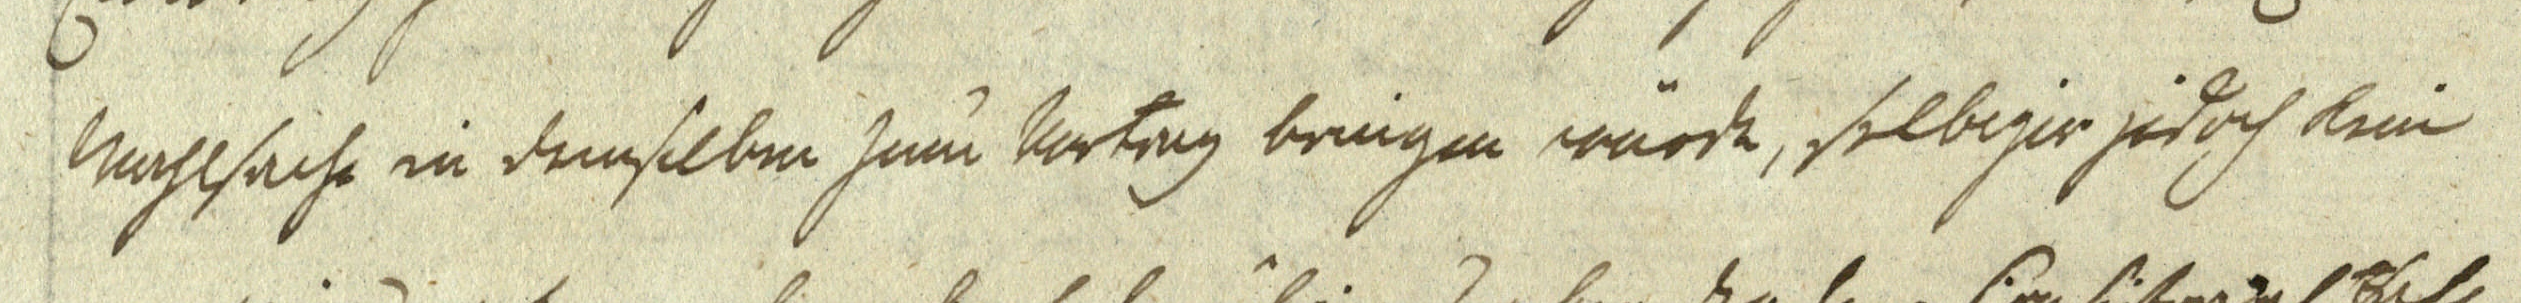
Wahlsache in demselben zum Vortrag bringen würde, selbiger jedoch kein
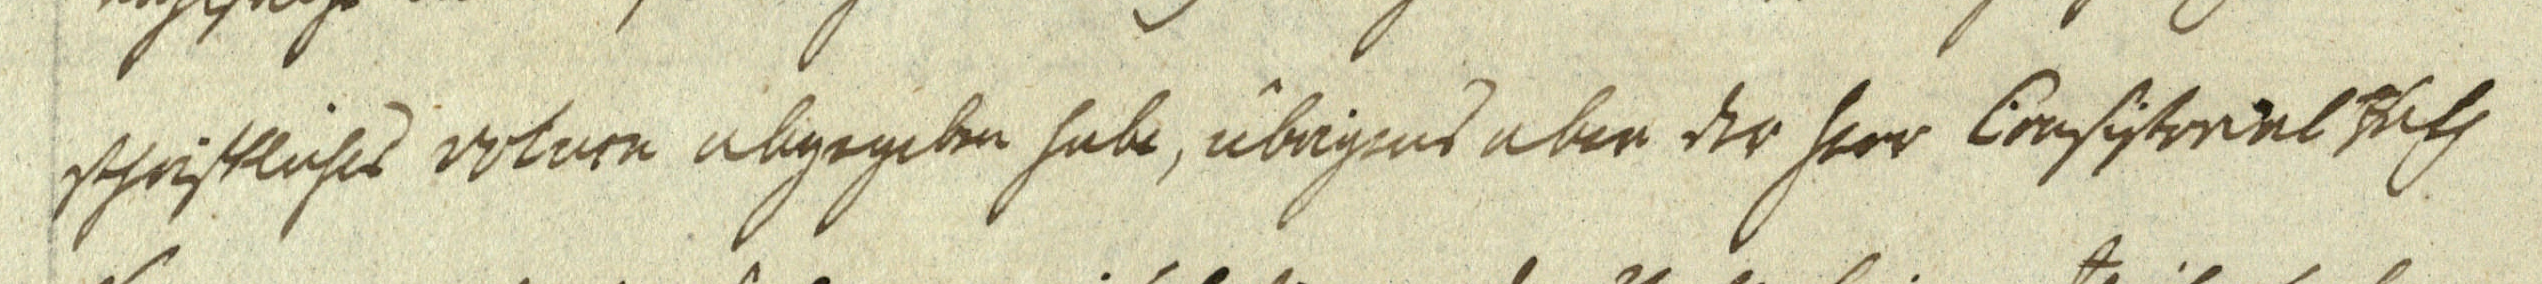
schriftliches votum abgegeben habe, übrigens aber der Herr ConsistorialRath
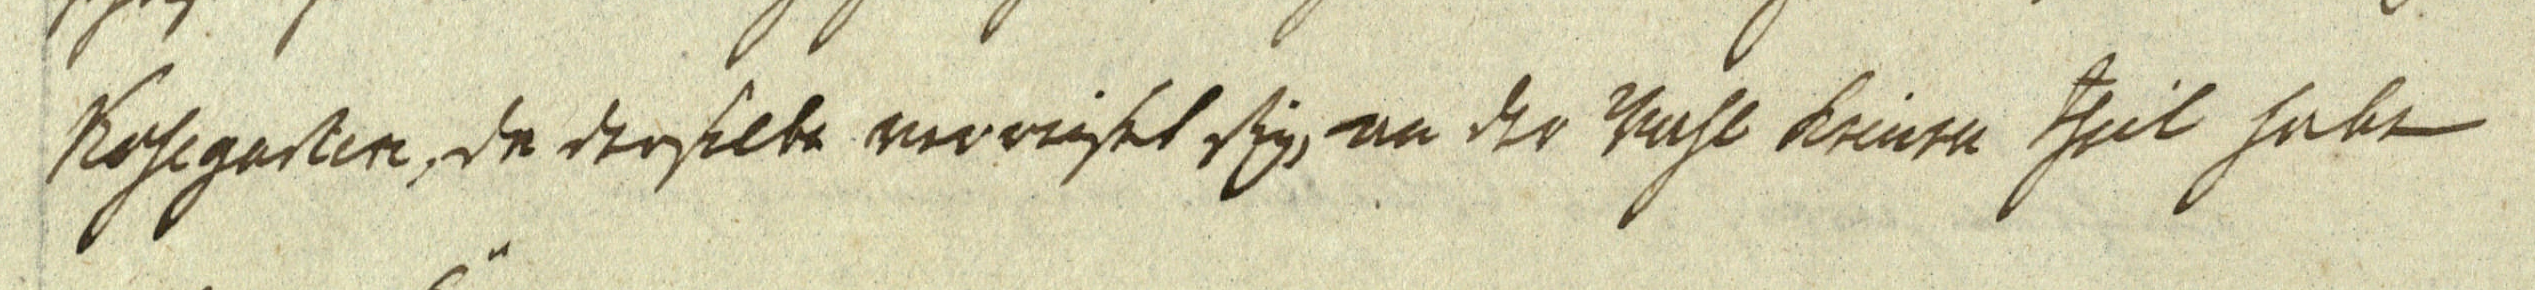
Kosegarten, da derselbe verreiset seÿ, an der Wahl keinen Theil habe
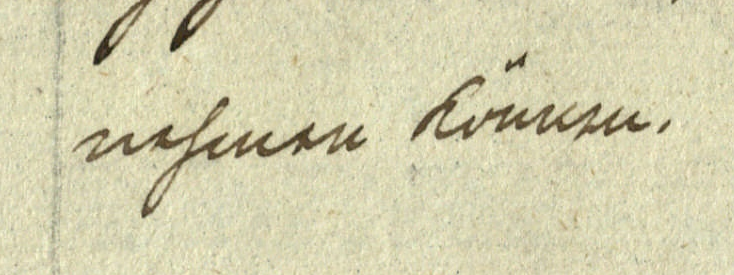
nehmen können.
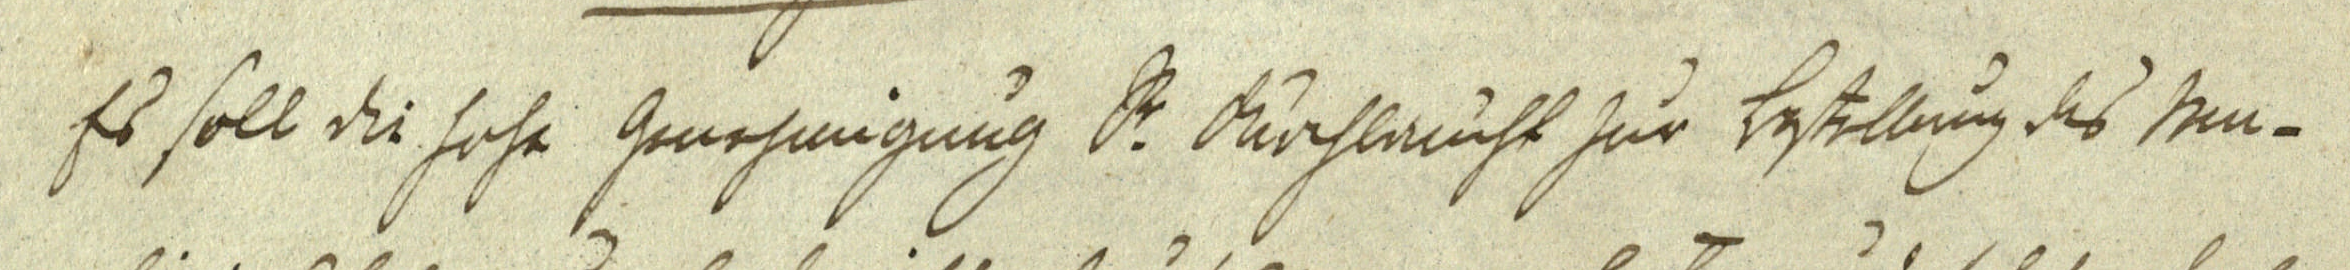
Es soll die hohe Genehmigung Sr. Durchlaucht zur Bestellug des Mu¬
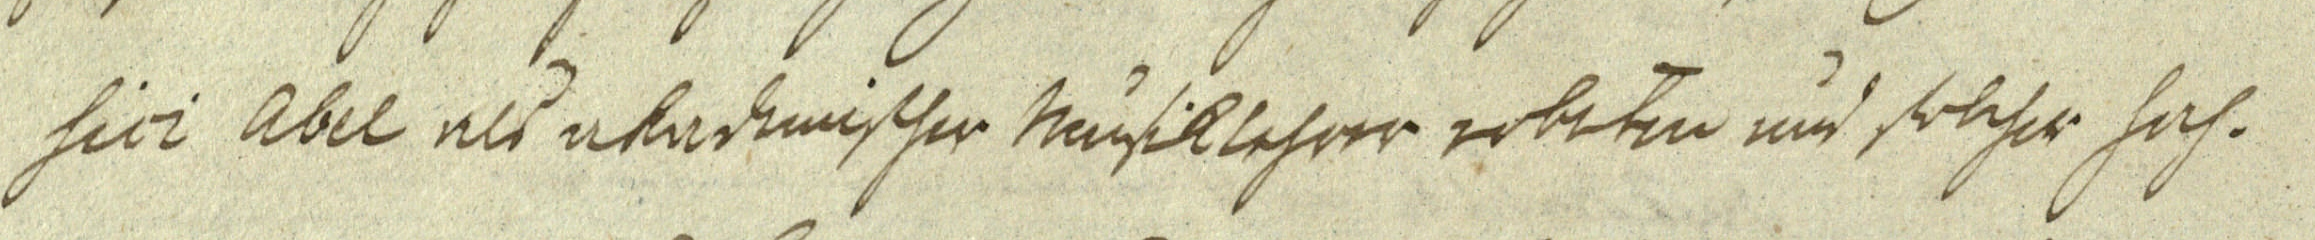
sici Abel als akademischer Musiklehrer erbeten und solcher hoch¬
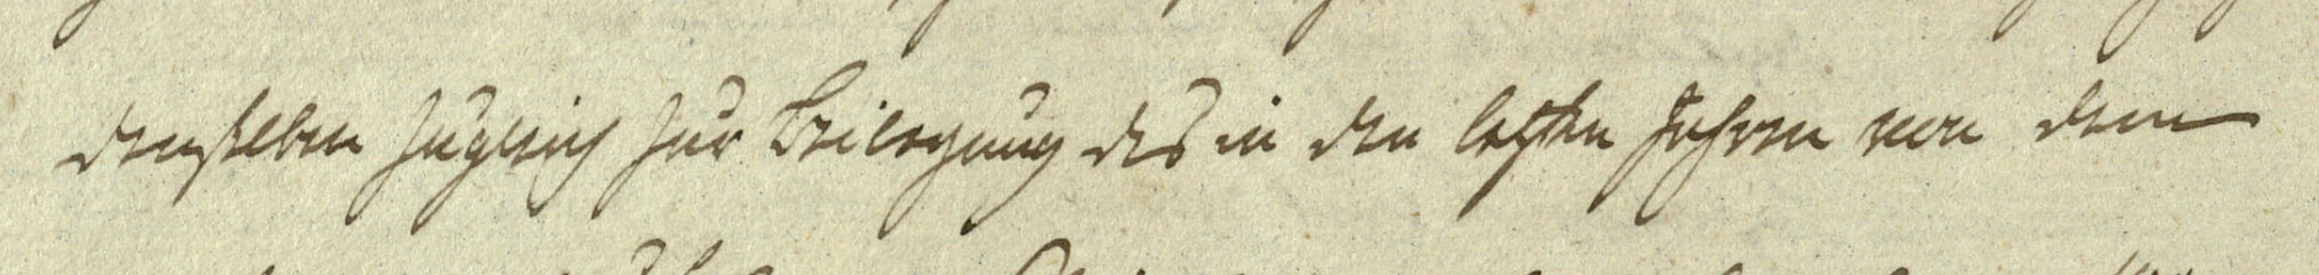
denselben zugleich zur Beilegung des in den letzten Jahren von dem
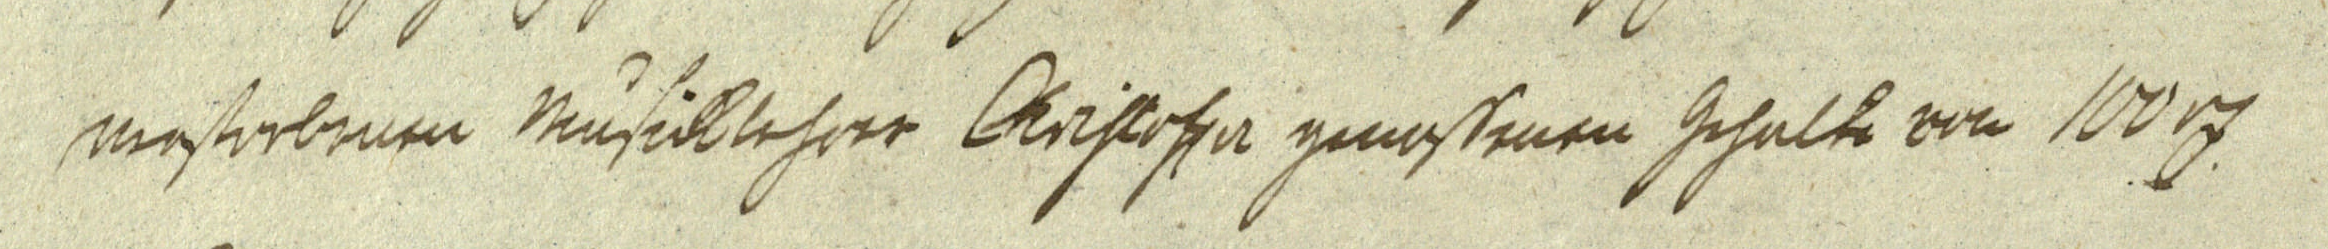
verstorbenen Musicklehrer Christopher genossenen Gehalte von 100 rt
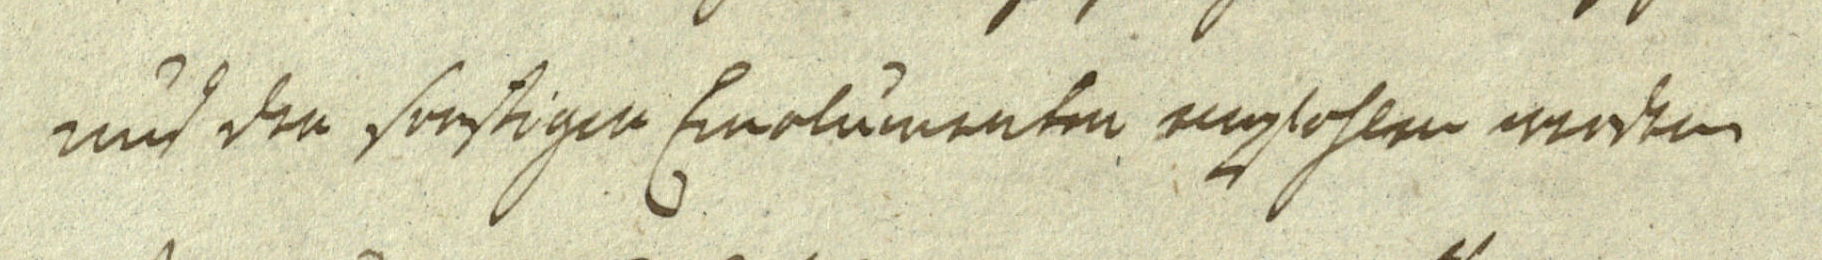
und den sonstigen Emolumenten empfohlen werden.
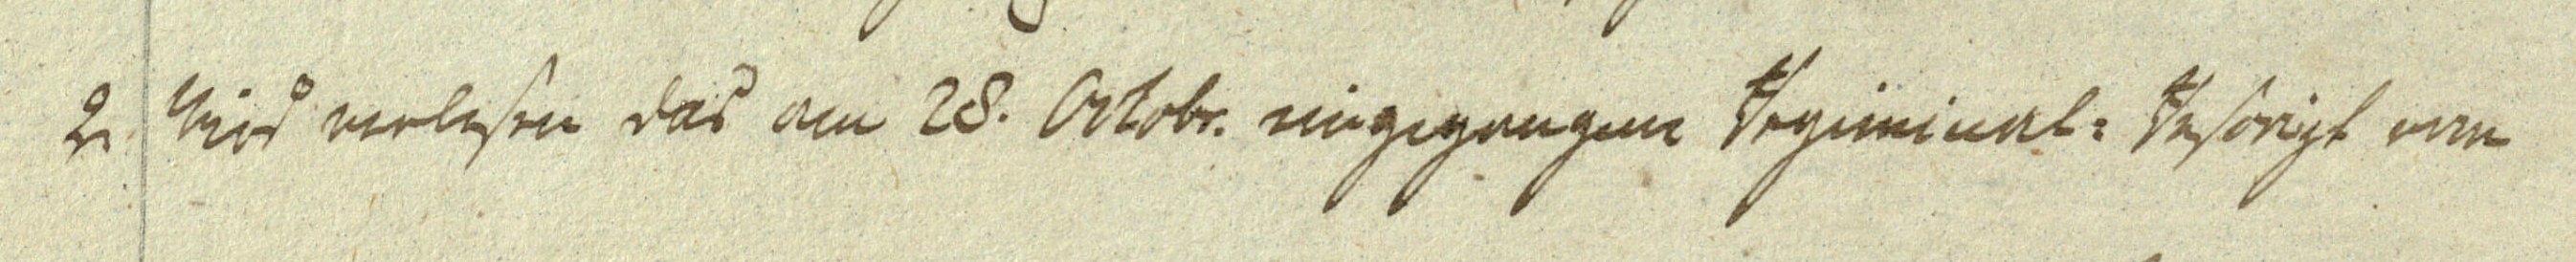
2. Wird verlesen das am 28. Octobr. eingegangene Regiminal- Rescript vom
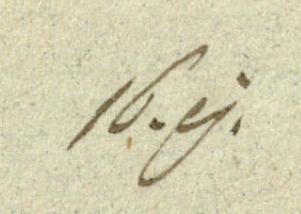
16. ej.
